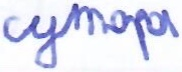сутора
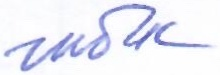чибис
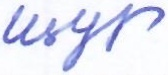щур
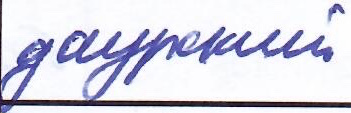даурский
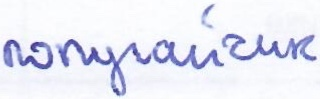попугайчик
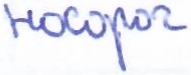носорог
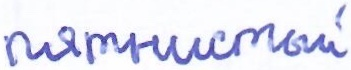пятнистый
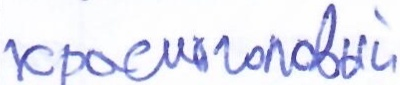красноголовый
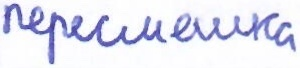пересмешка
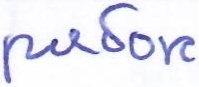рябок
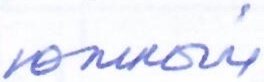южный
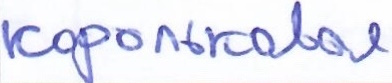корольковая
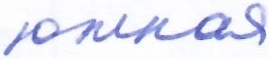южная
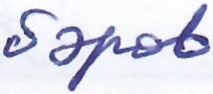бэров
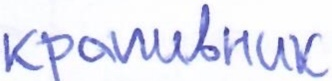крапивник
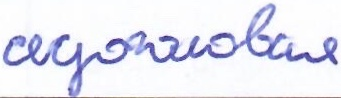седоголовая
